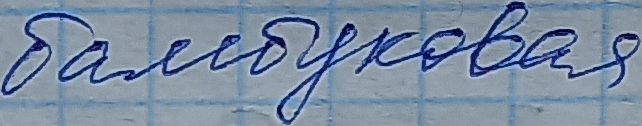бамбуковая
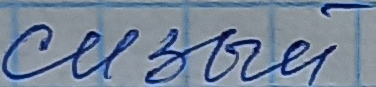сизый
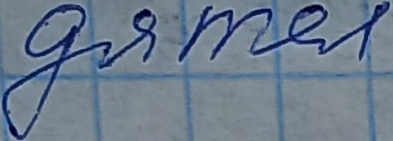дятел
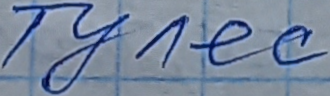тулес
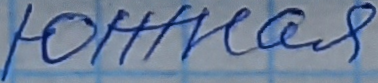южная
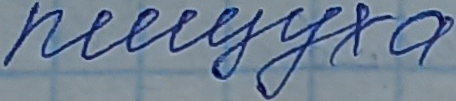пищуха
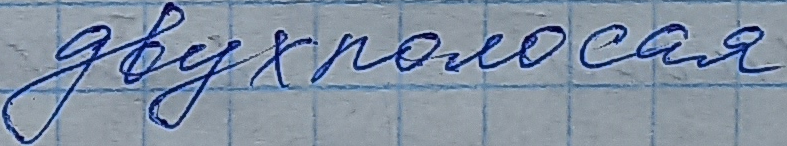двухполосая
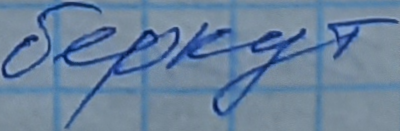беркут
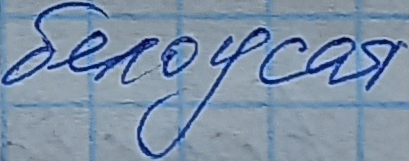белоусая
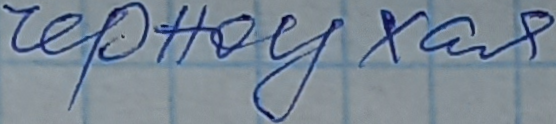черноухая
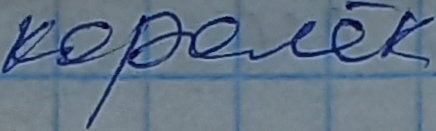королёк
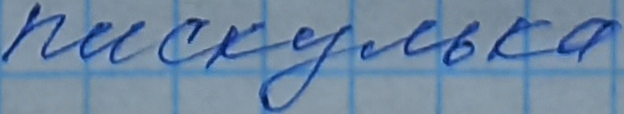пискулька
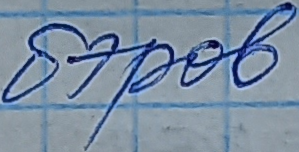бэров
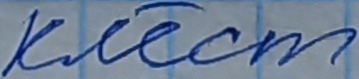клёст
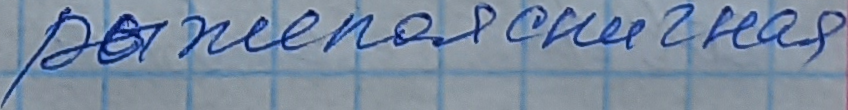рыжепоясничная
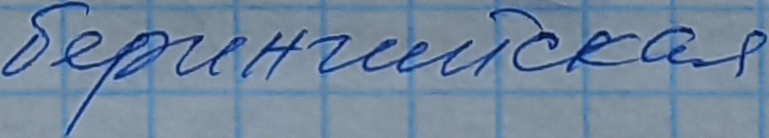берингийская
